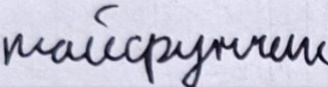тайфунчик
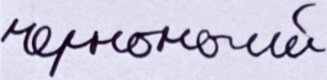черноногий
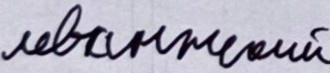левантский
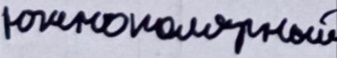южнополярный
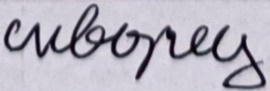скворец
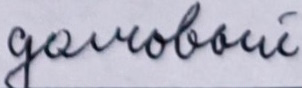домовый
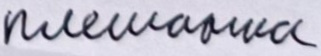плешанка
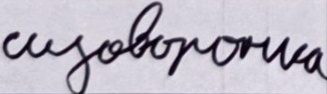сизоворонка
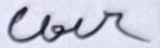сыч
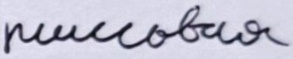тиссовая
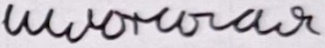шлоногая
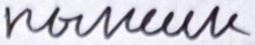пыжик
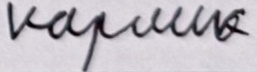карлик
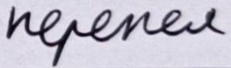перепел
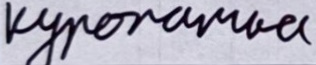куропатка
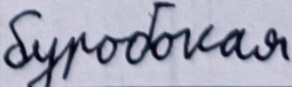буробокая
